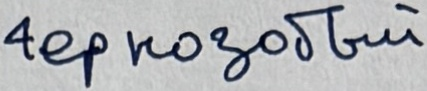чернозобый
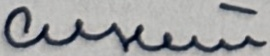синий
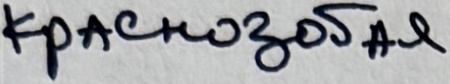краснозобая
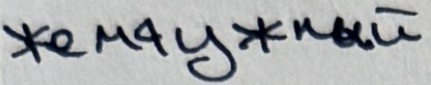жемчужный
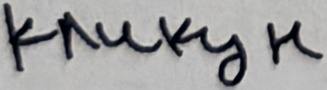кликун
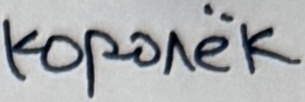королёк
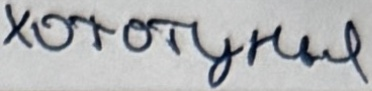хототунья
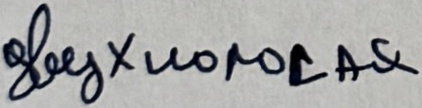двухполосая
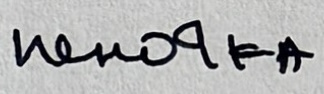пеночка
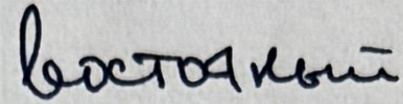восточный
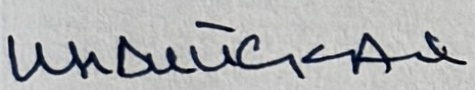индийская
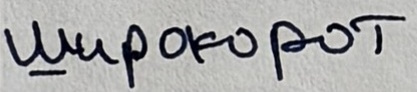широкорот
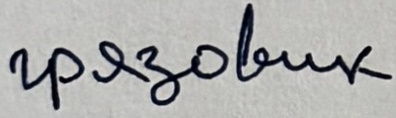грязовик
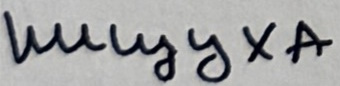пищуха
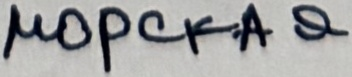морская
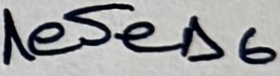лебедь
